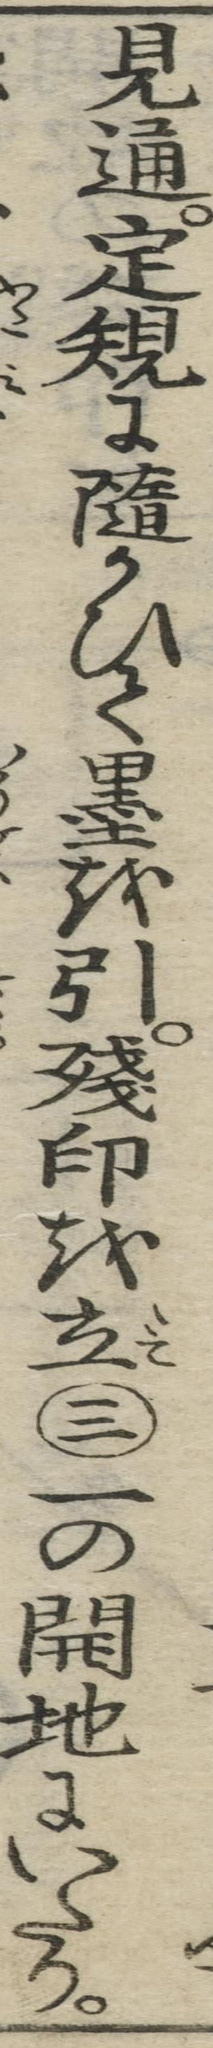見通。定規に随かひて墨を引。残印を立㊂一の開地にいたり。
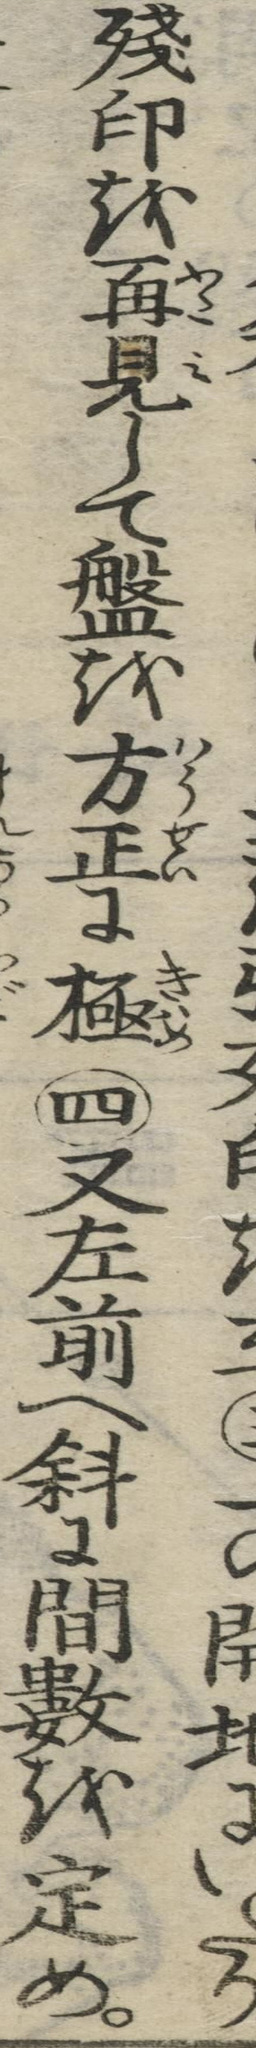残印を再見して盤を方正に極㊃又左前へ斜に間数を定め。
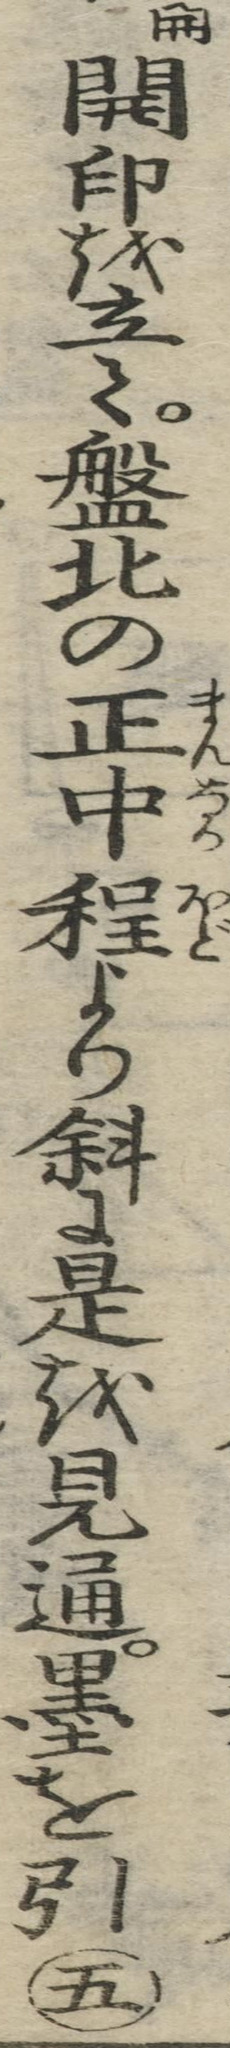左斜開三町開印を立て。盤北の正中程斜に是を見通。墨を引㊄

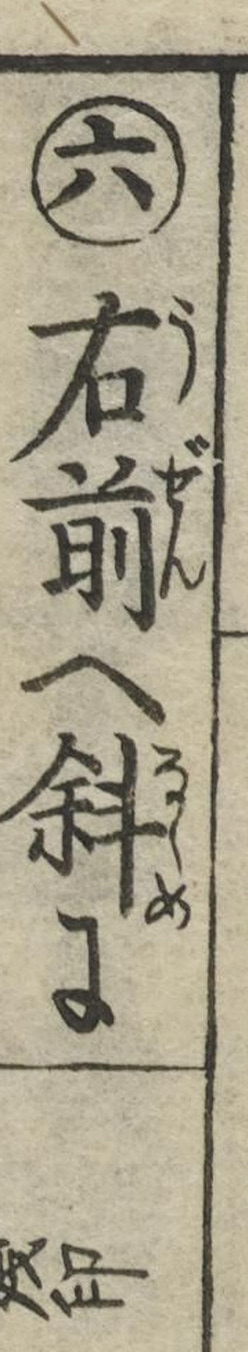㊅右前へ斜に
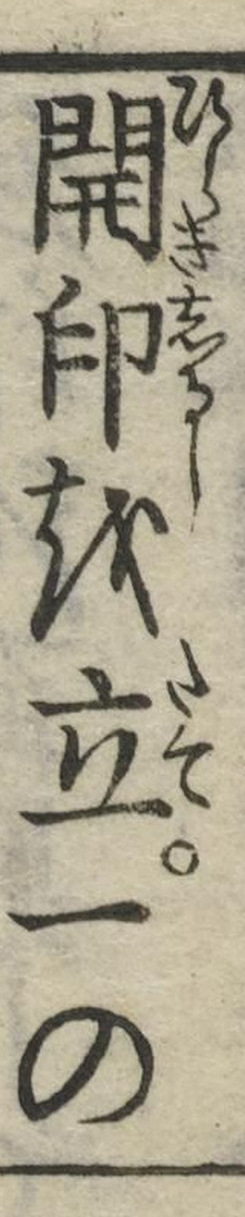開印を立。一の
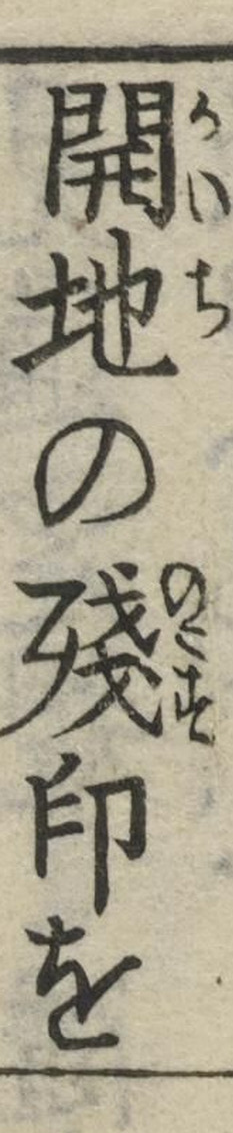開地の残印を
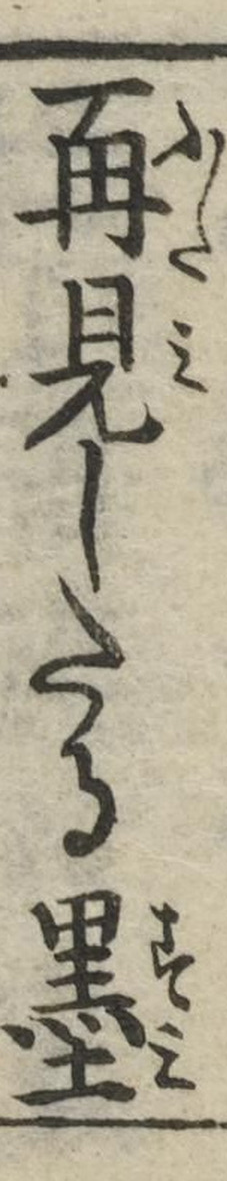再見したる墨
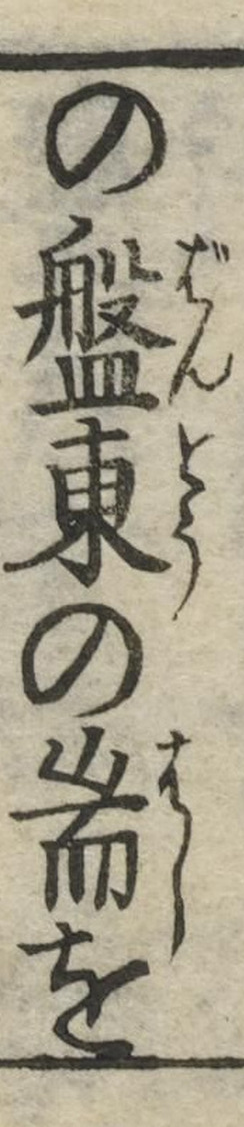の盤東の端を
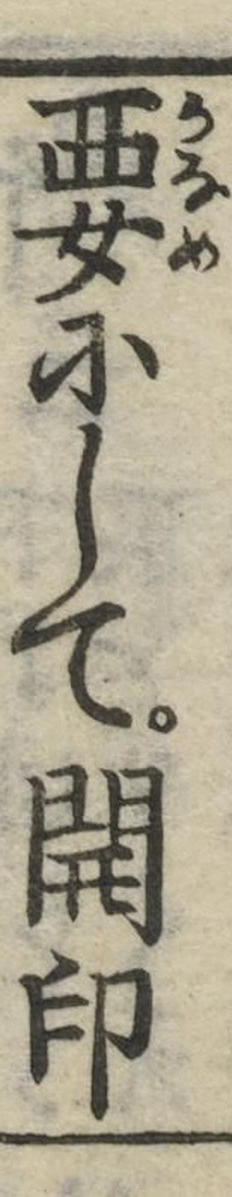要にして。開印
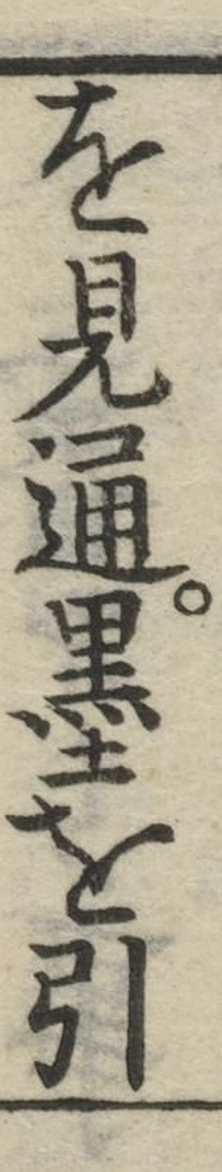を見通。墨を引
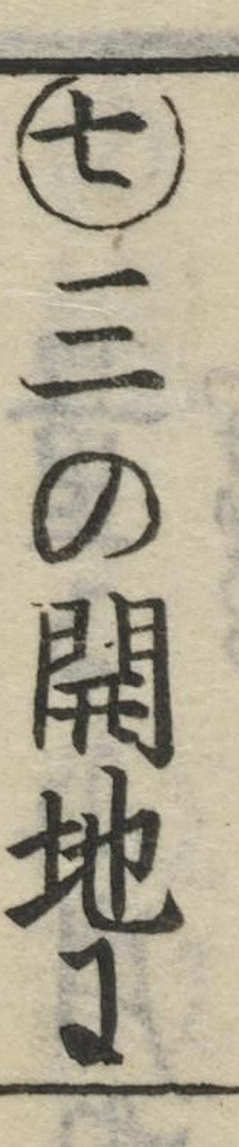㊆三の開地に
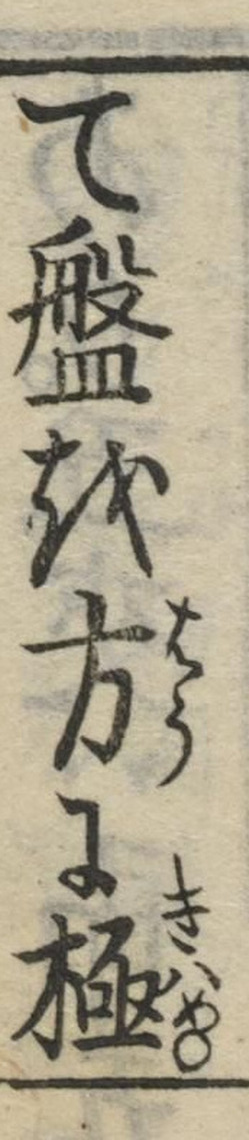て盤を方に極。
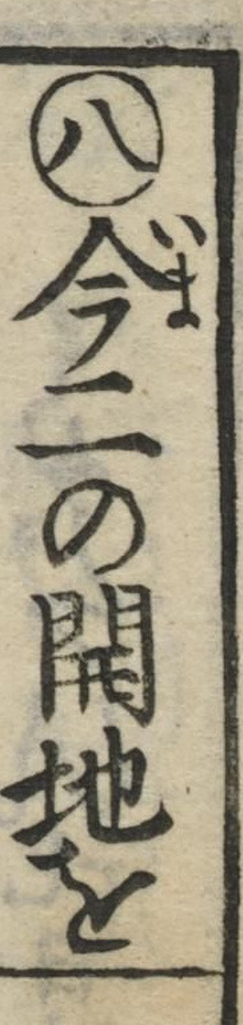㊇今二の開地を
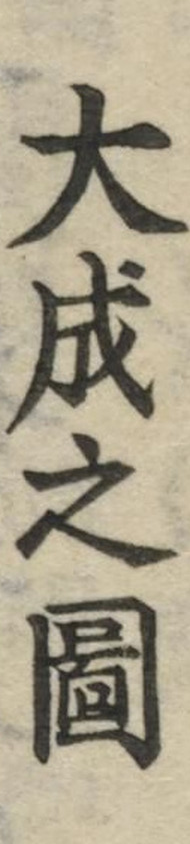大成之図
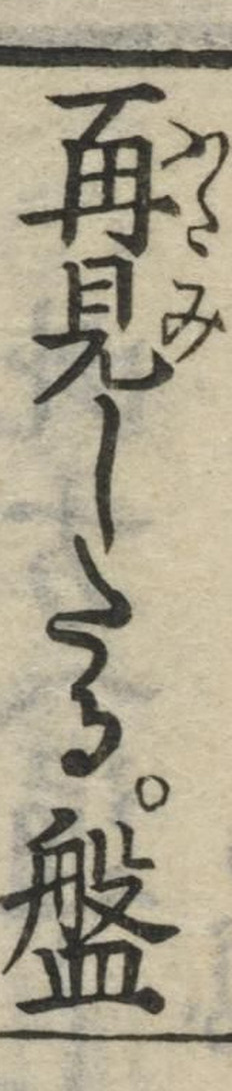再見したる。盤
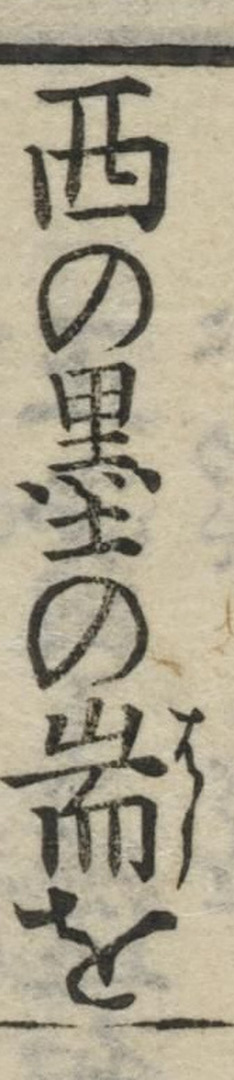西の墨の端を
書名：量地指南　巻之二（内題）
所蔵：東京大学地震研究所図書室 Earthquake Research Institute Library, The University of Tokyo, JAPAN
